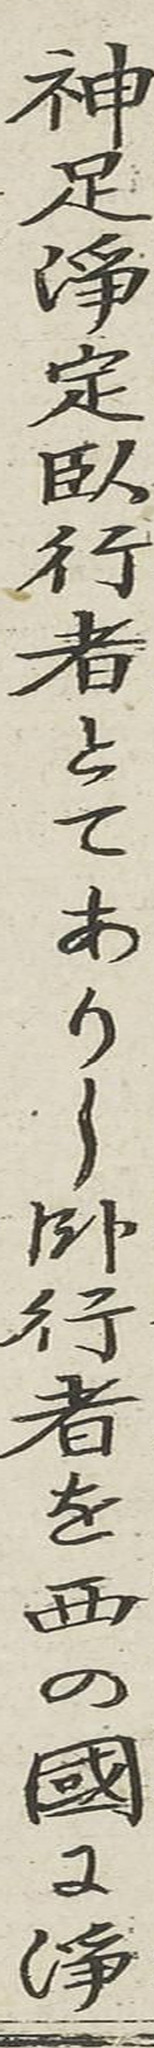神足浄定臥行者とてありし臥行者を西の国に浄
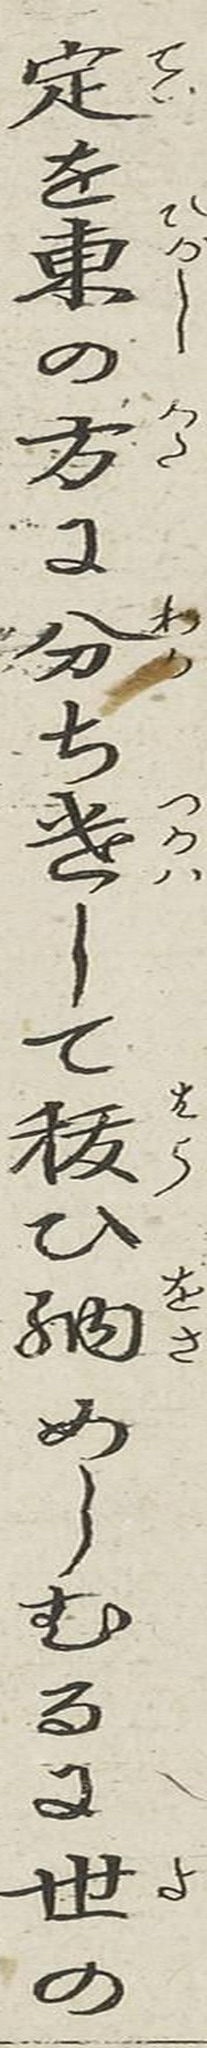定を東の方に分ち遣して祓ひ納めしむるに世の
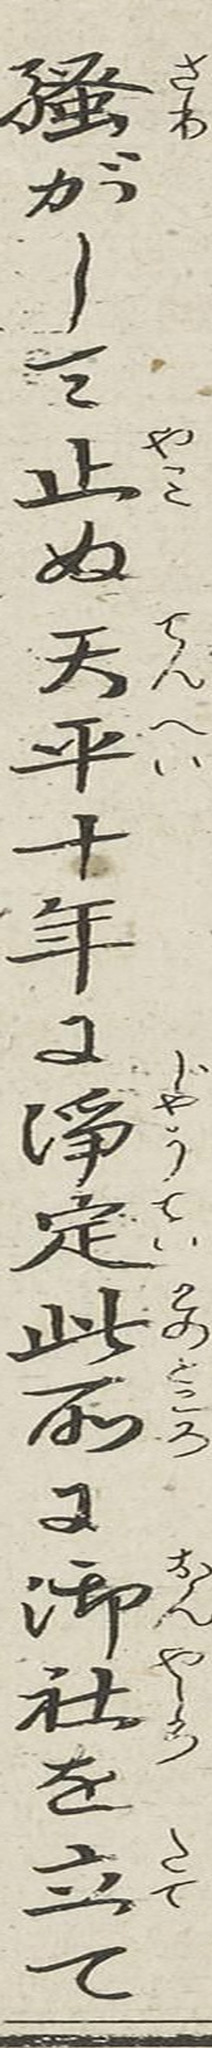騒がして止ぬ天平十年に浄定此所に御社を立て
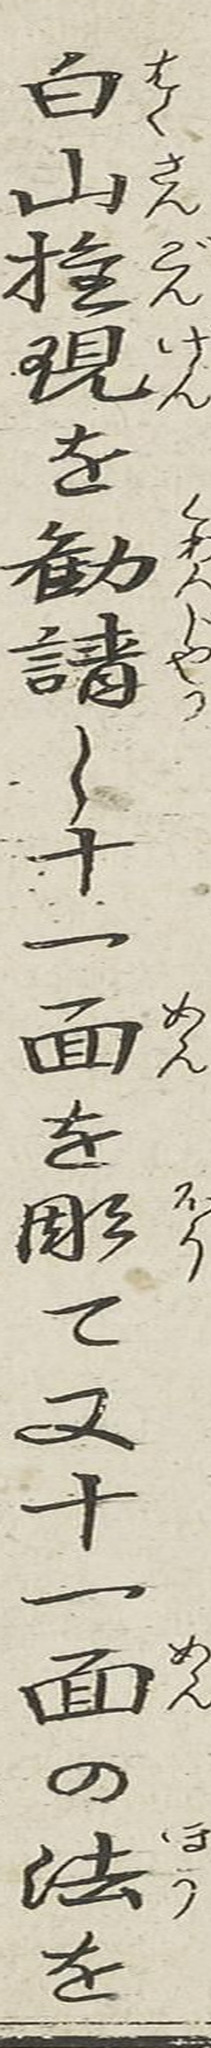白山権現を勧請し十一面を彫て又十一面の法を
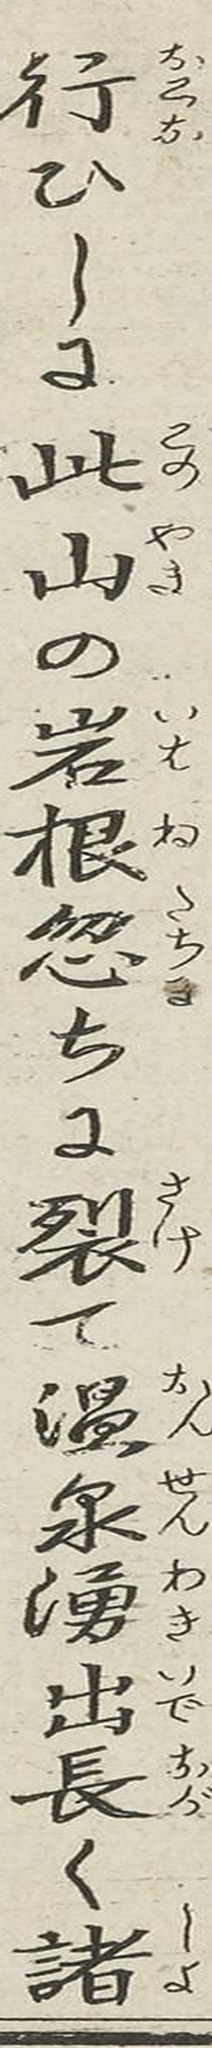行ひしに此山の岩根忽ちに裂て温泉湧出長く諸
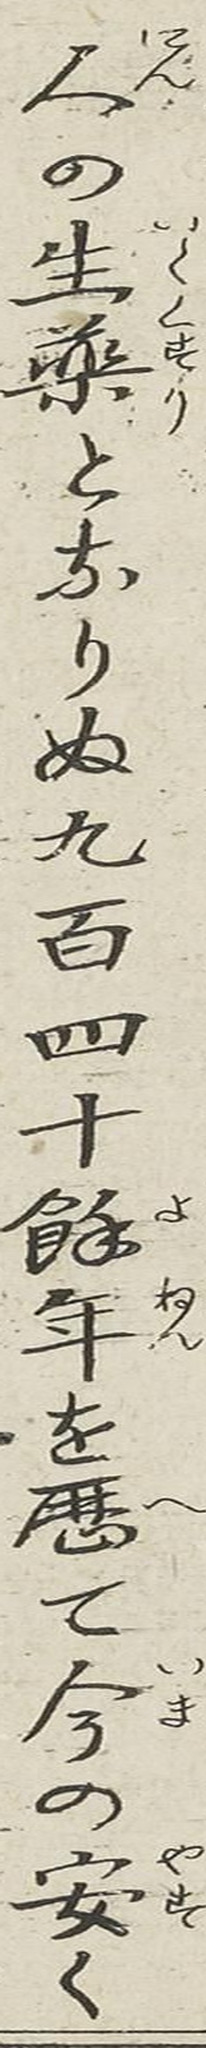人の生薬となりぬ九百四十余年を歴て今の安く
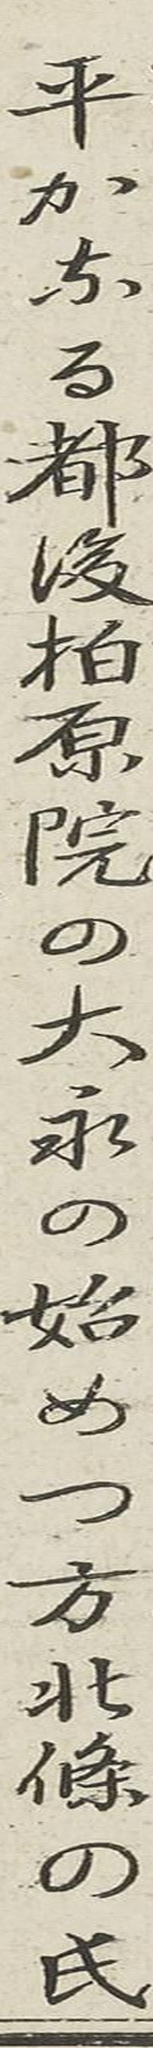平かなる都後柏原院の大永の始めつ方北条の氏
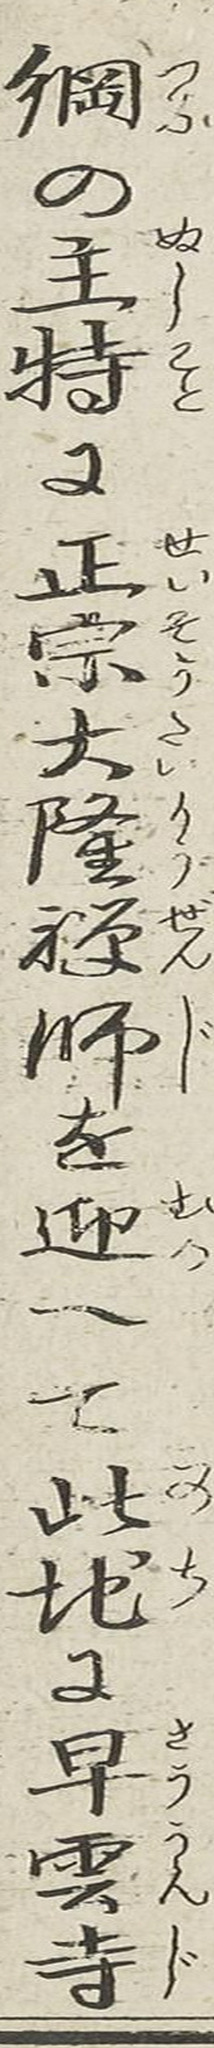綱の主特に正宗大隆禅師を迎へて此地に早雲寺
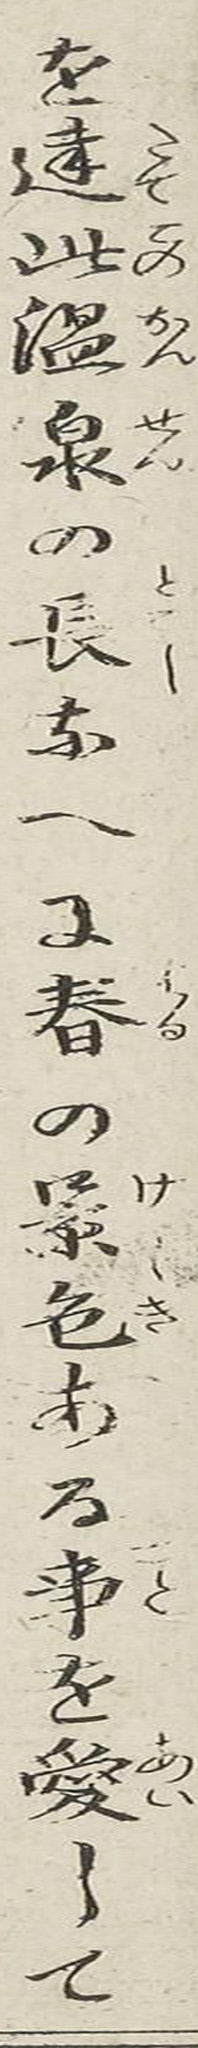を建此温泉の長なへに春の景色ある事を愛して
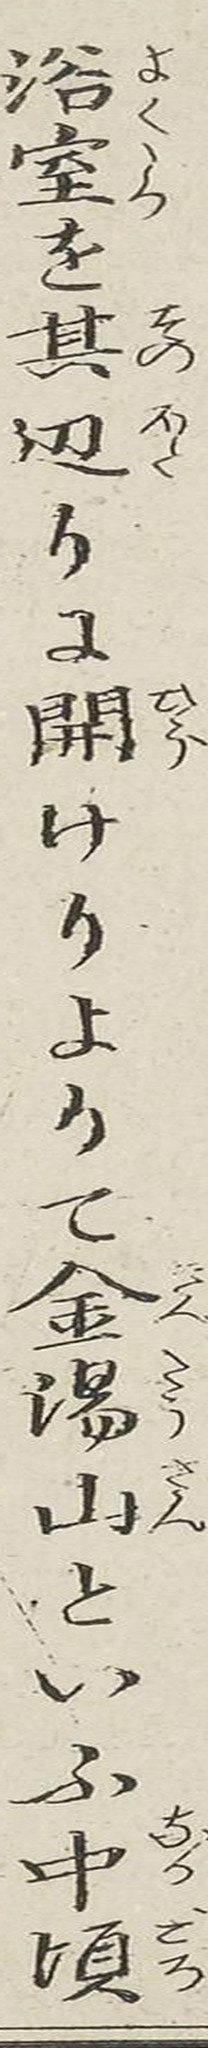浴室を其辺りに開けりよりて金湯山といふ中頃
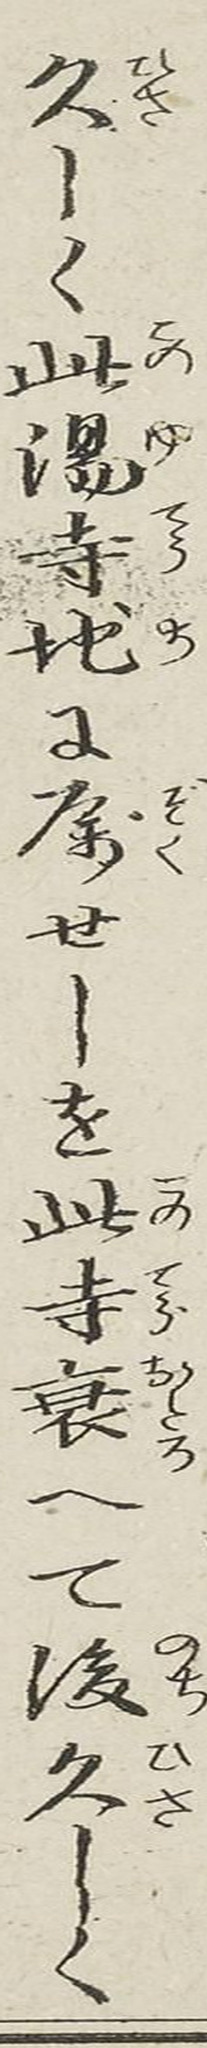久しく此湯寺地に属せしを此寺衰へて後久しく
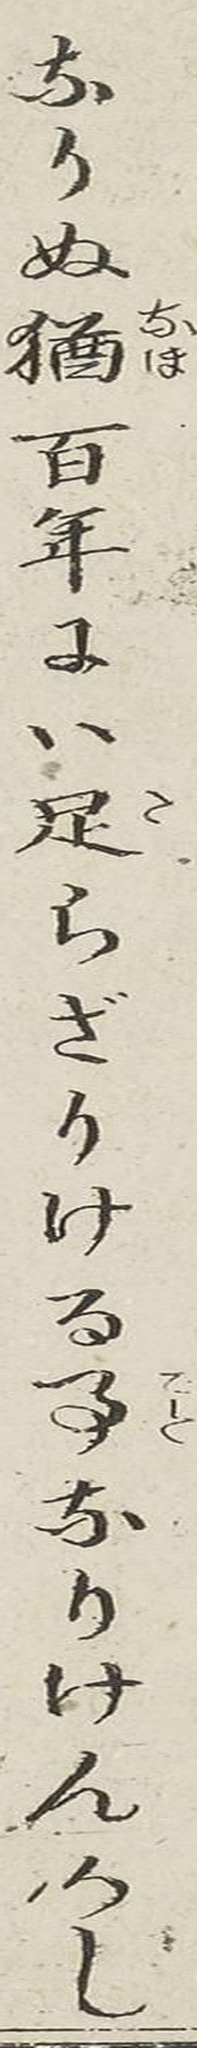なりぬ猶百年には足らざりける事なりけんかし
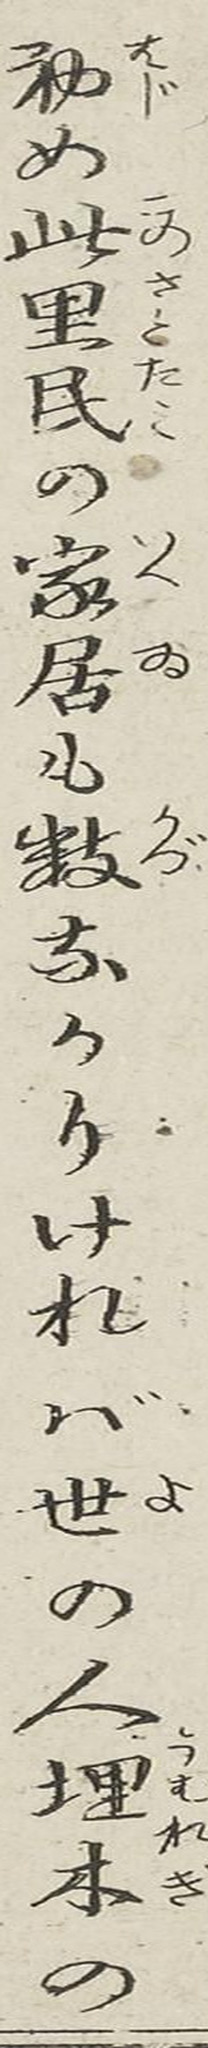初め此里民の家居も数なかりければ世の人埋木の
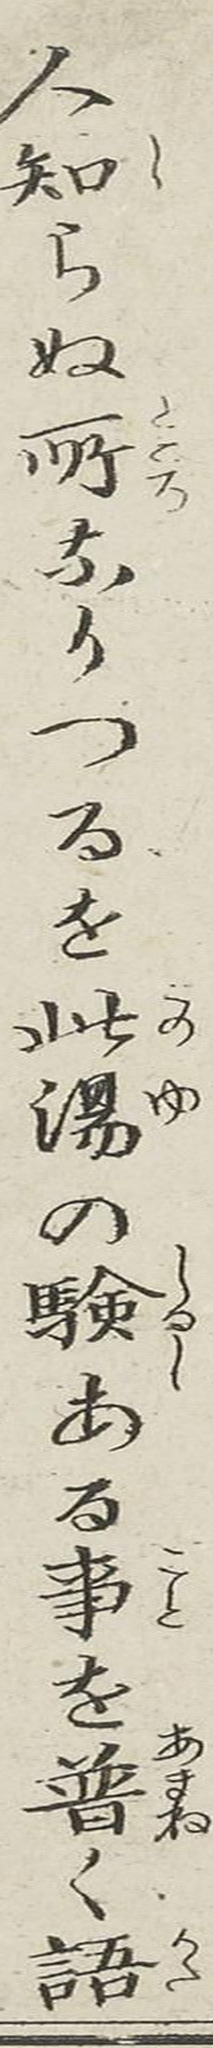人知らぬ所なりつるを此湯の験ある事を普く語
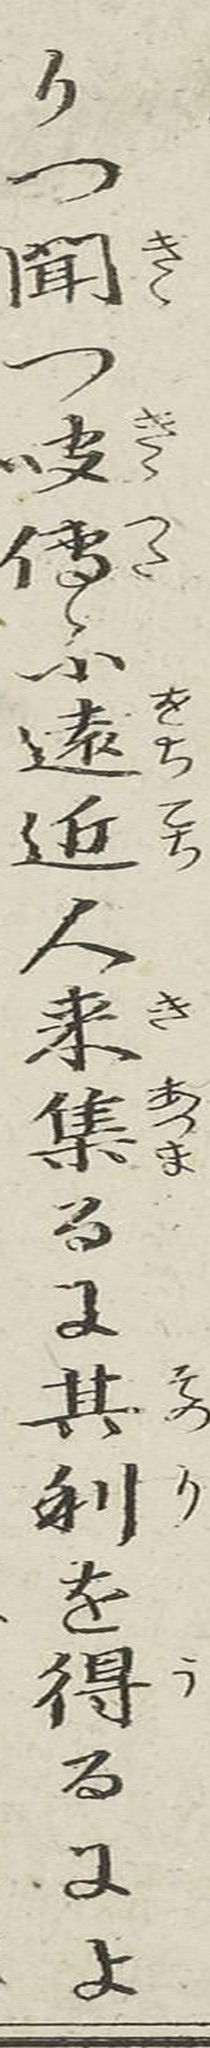りつ聞つ聞伝ふ遠近人来集るに其利を得るによ
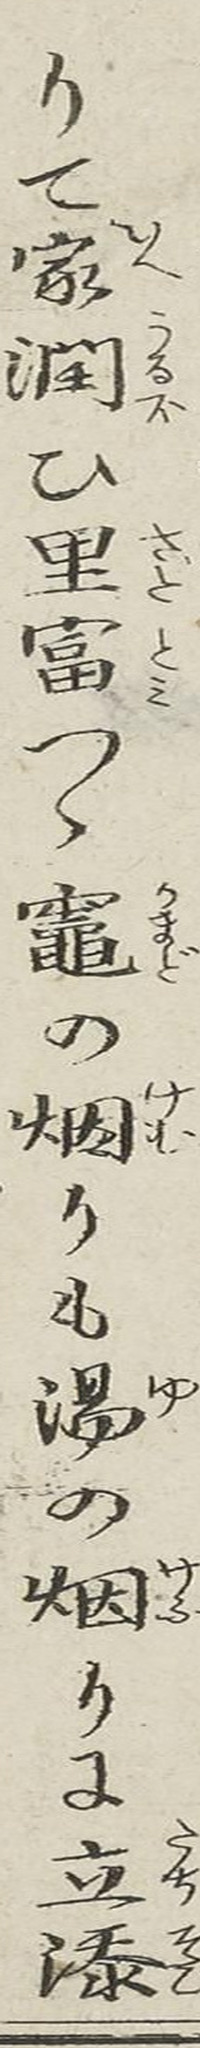りて家潤ひ里富つゝ竈の烟りも湯の烟りに立添
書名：箱根温泉誌　全
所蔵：東京大学地震研究所図書室 Earthquake Research Institute Library, The University of Tokyo, JAPAN
